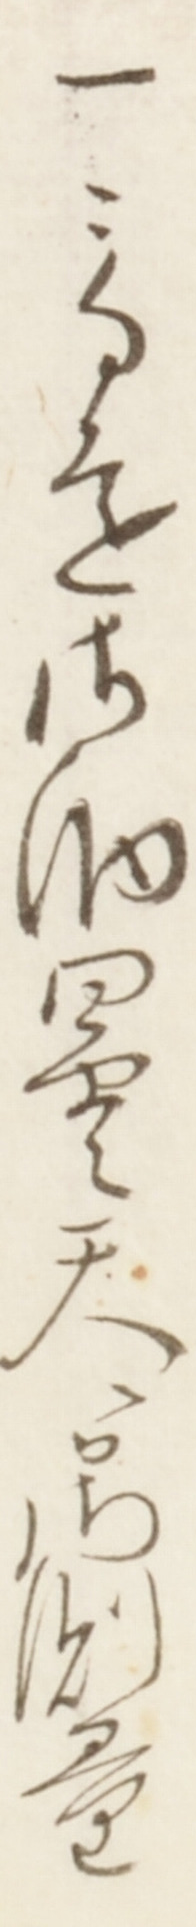一高遠御泊曇天ニ而御測量
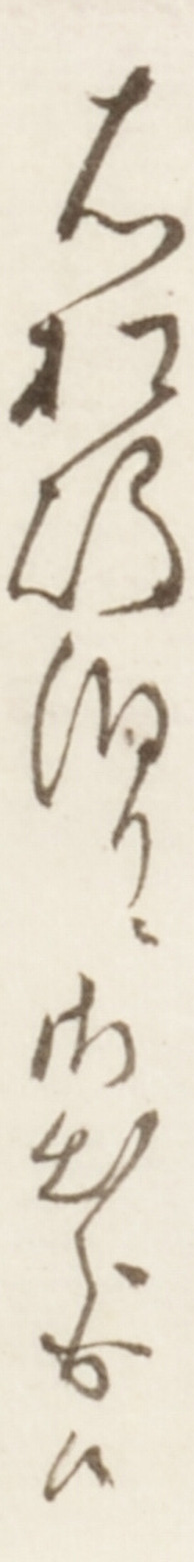右松嶋泊りニ御出被成候
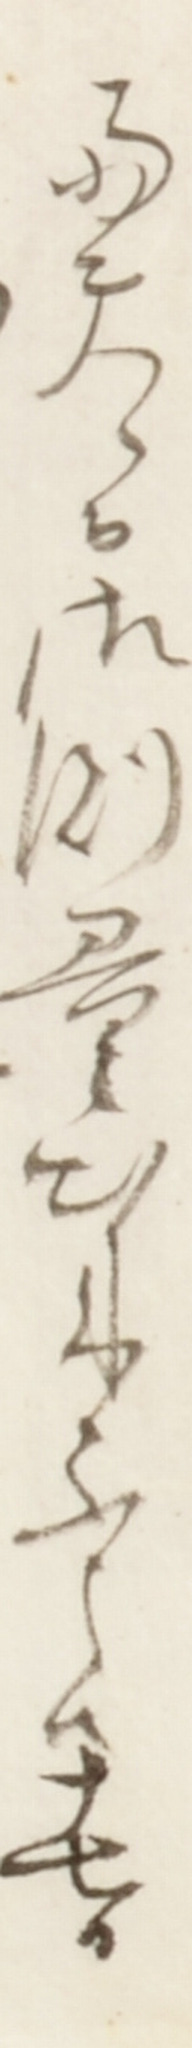雨天ニ而御測量出来不申候十七日
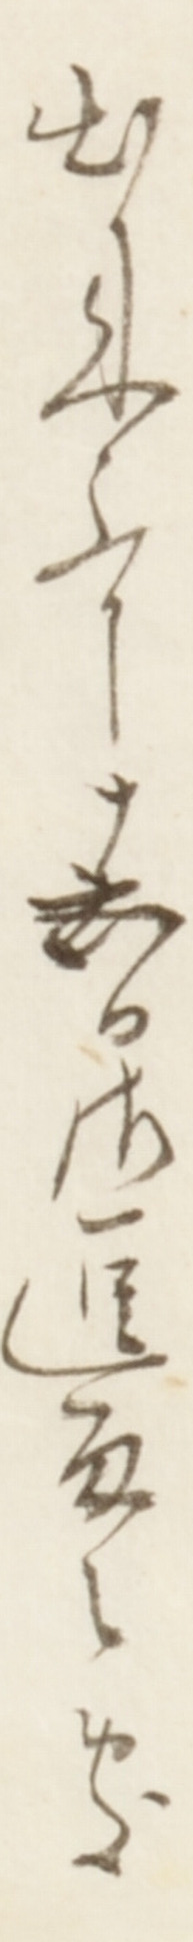出来不申十六日御逗留之処

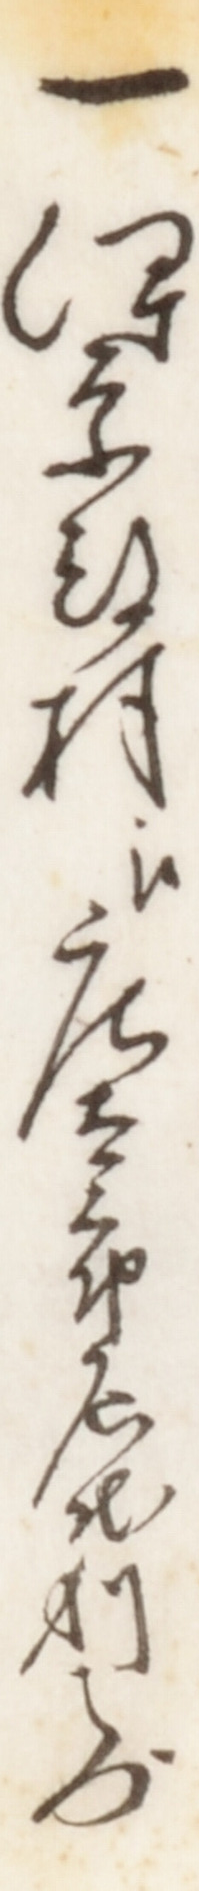一伊那部村江庄太郎名代利右衛門
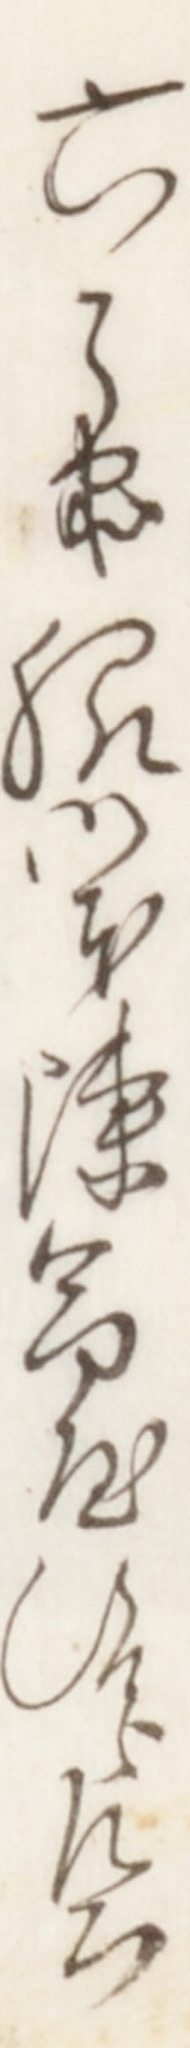六兵衛脇御本陣富屋治郎左衛門
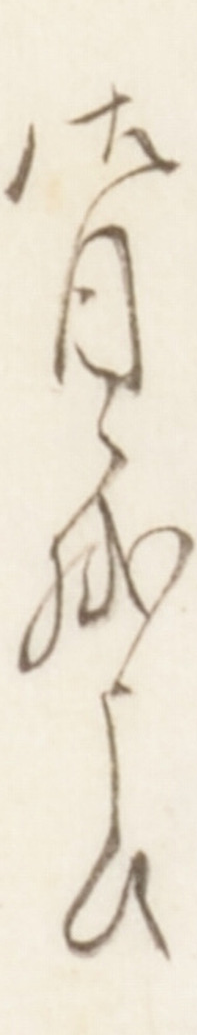御目被掛申候
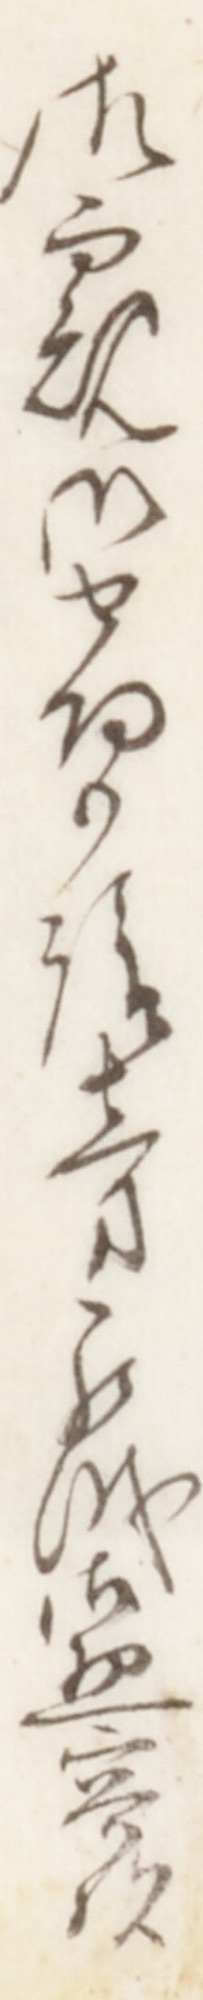御窺御宿可請旁罷越御惣客様
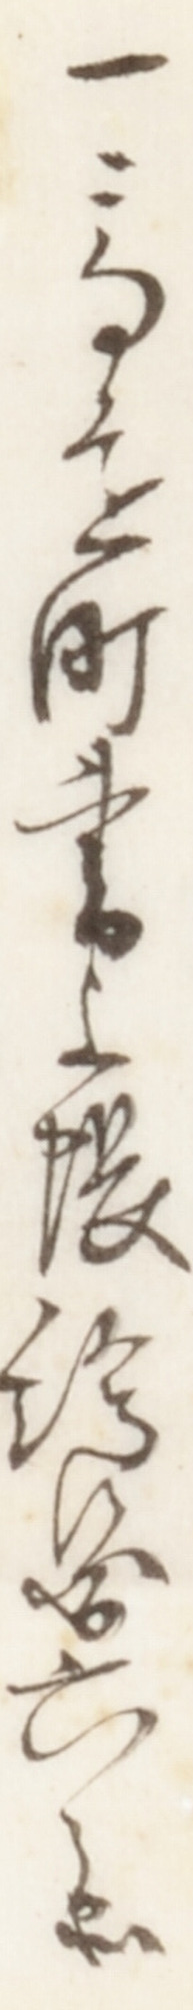一高遠町書上帳絵図六兵衛
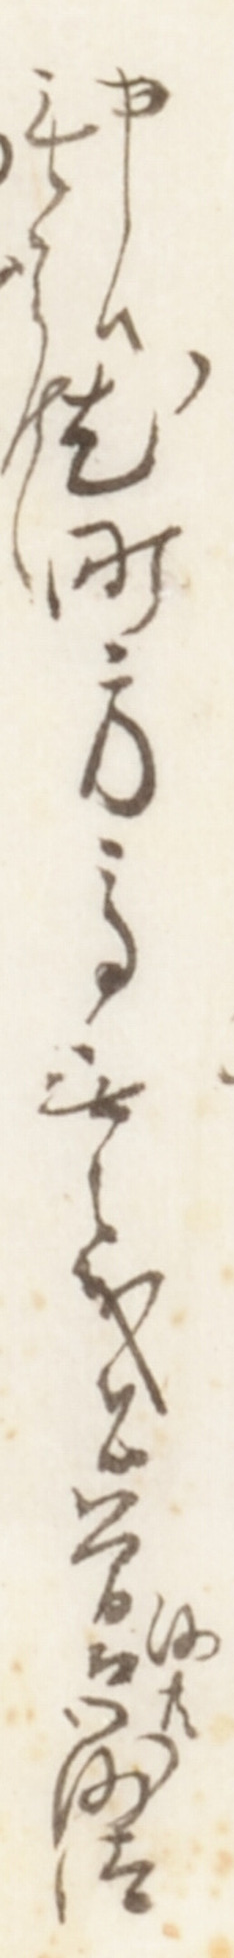申候尤町方高無之義者曽而何共御沙汰
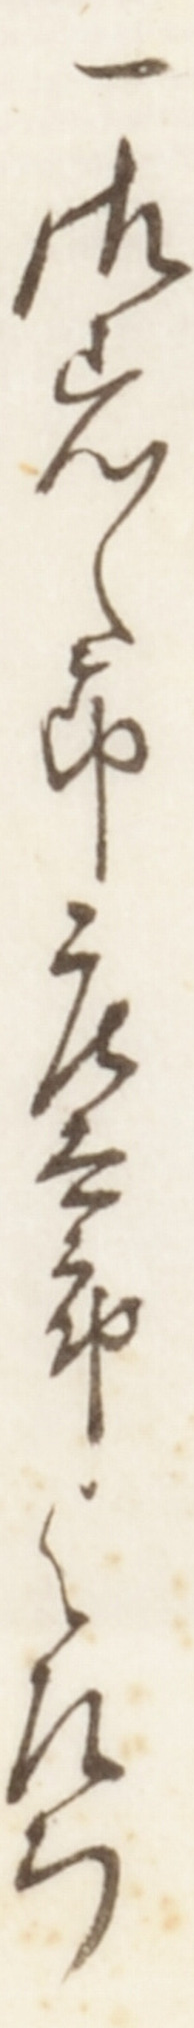一高遠御着之節庄太郎与左衛門
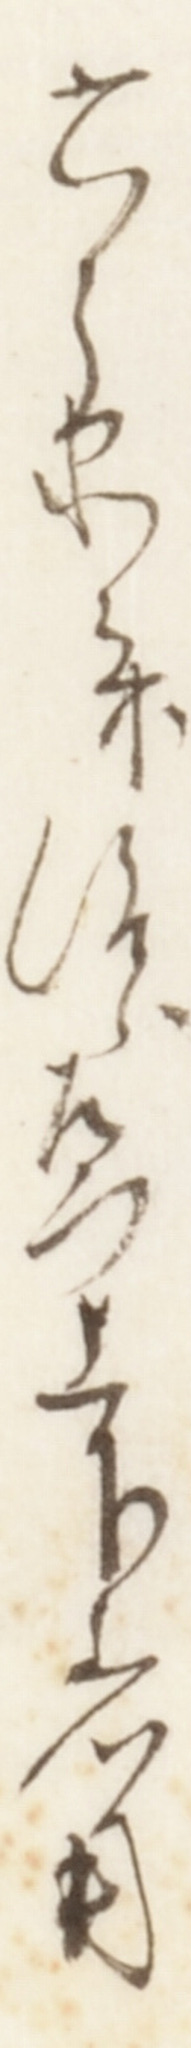六兵衛并治郎左衛門上下着用
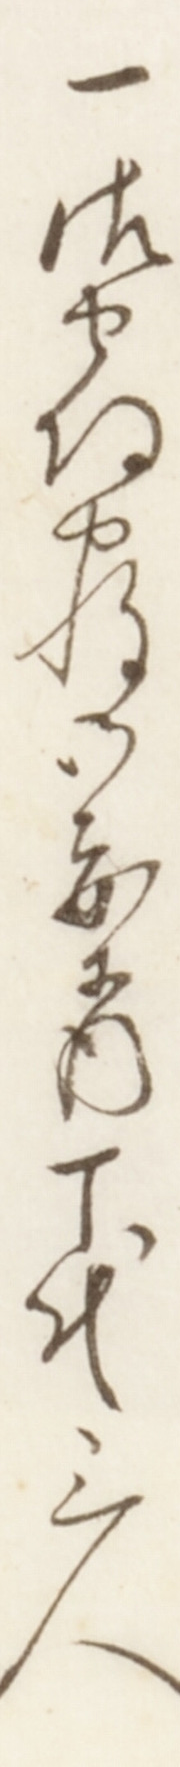一御宿為御案内丁代三人
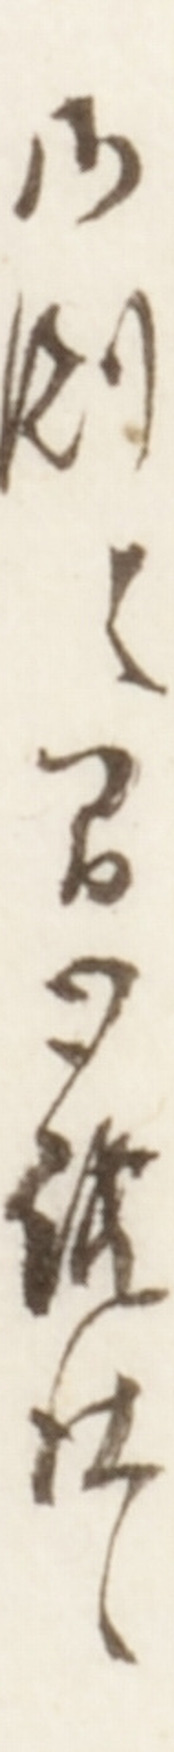御測候間御供仕候
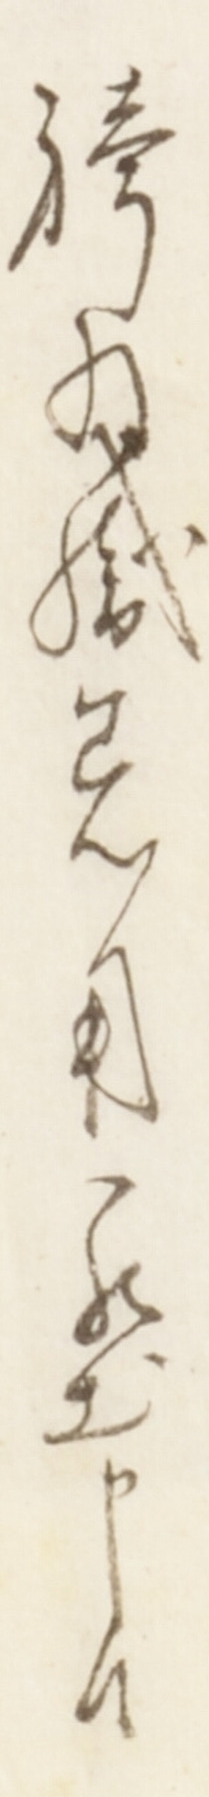袴羽織着用罷出申候
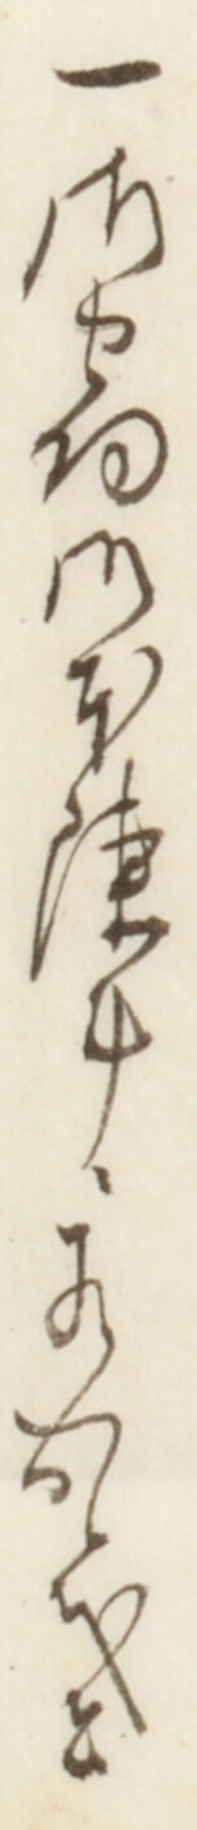一御宿御本陣斗ニ相成義者
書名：御測量諸事控
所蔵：伊那市立高遠町図書館・合同会社AMANE
